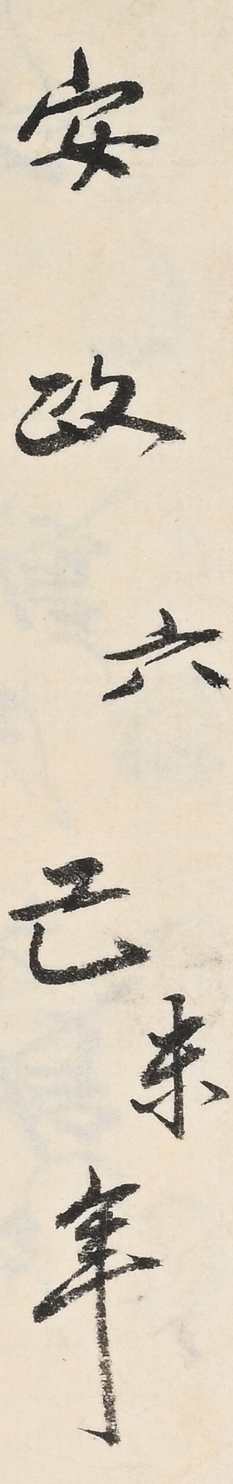安政六己未年
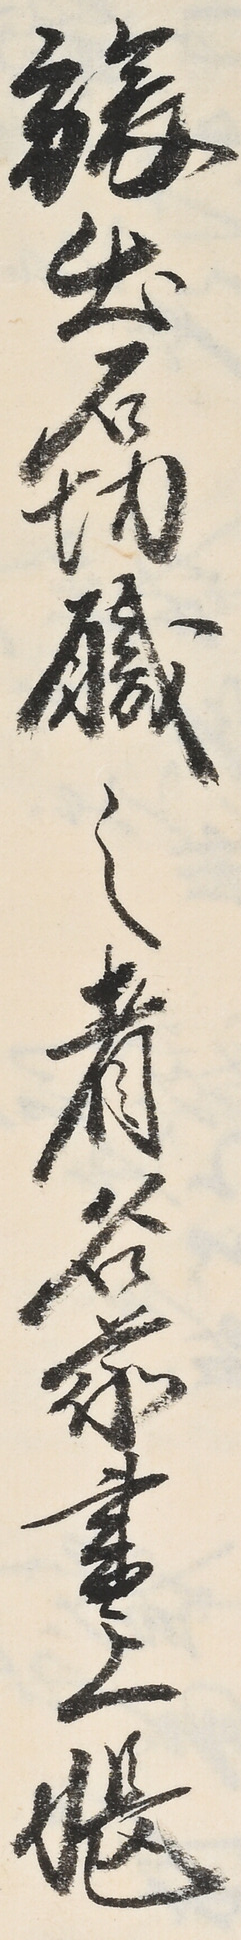旅出石切職之者名前書上帳

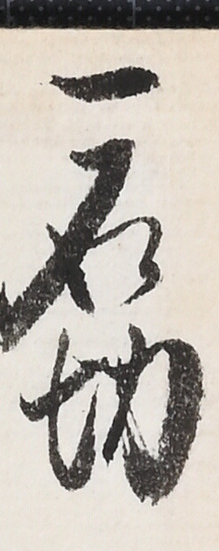一石切
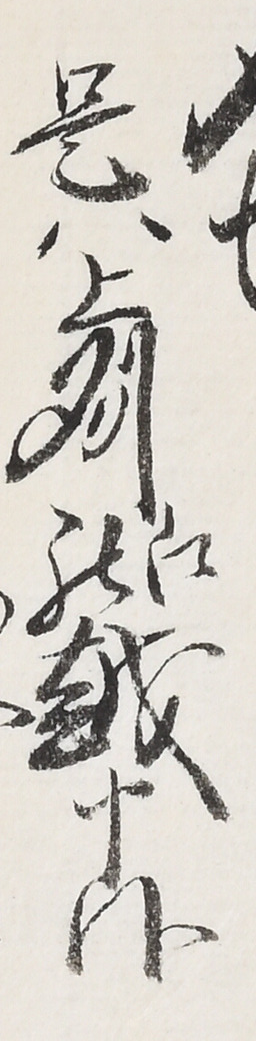是は上州え罷越申候
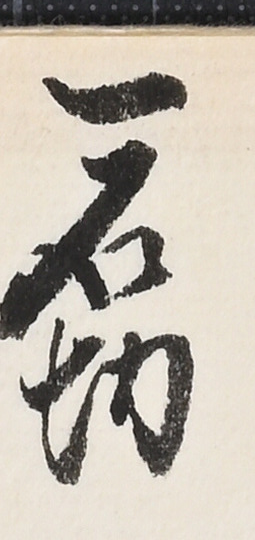一石切
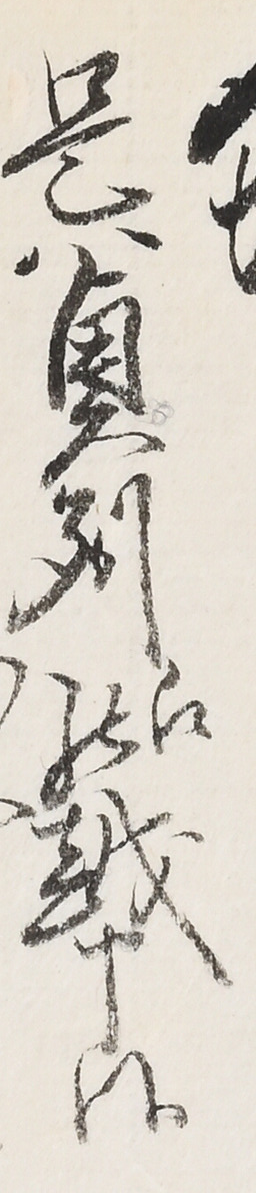是は奥州え罷越申候
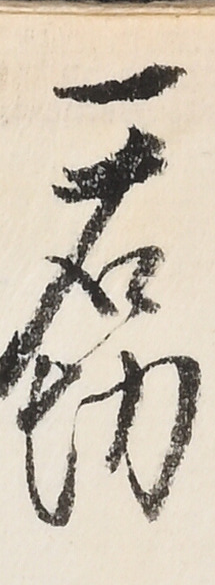一石切
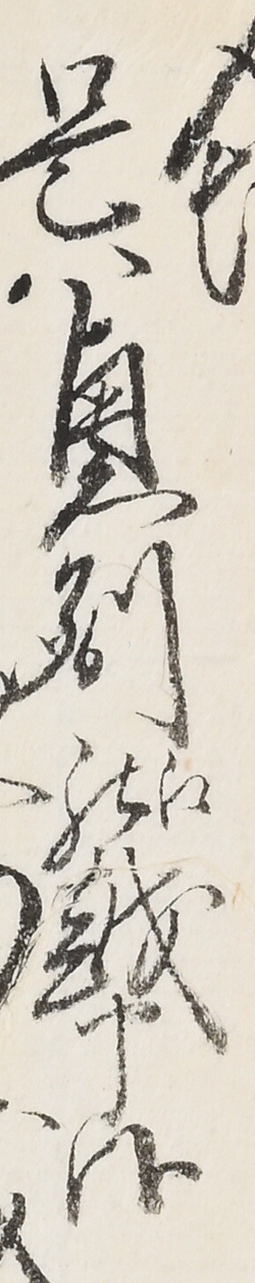是は上州え罷越申候
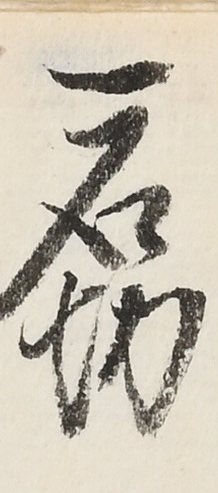一石切
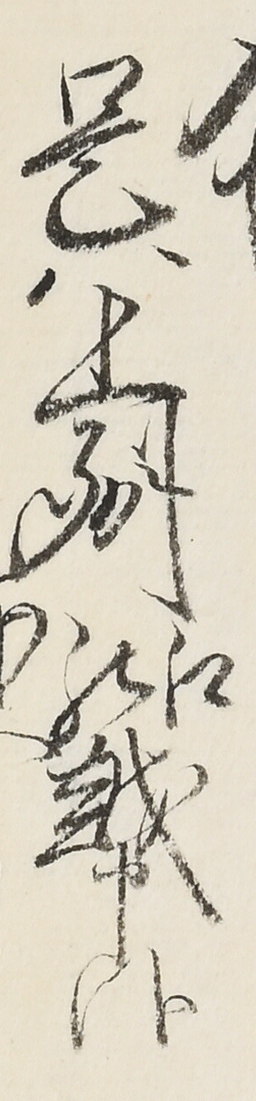是は上州え罷越申候

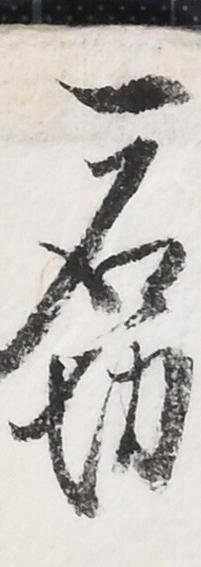一石切
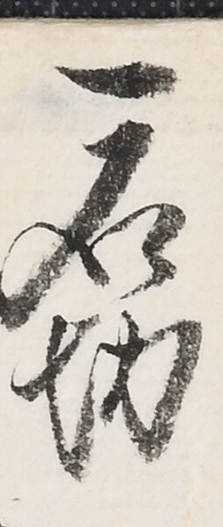一石切
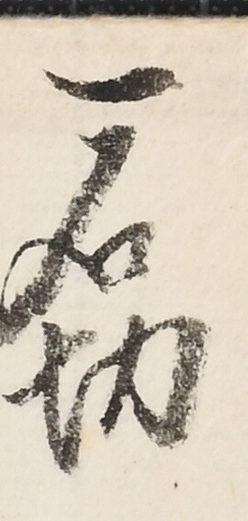一石切
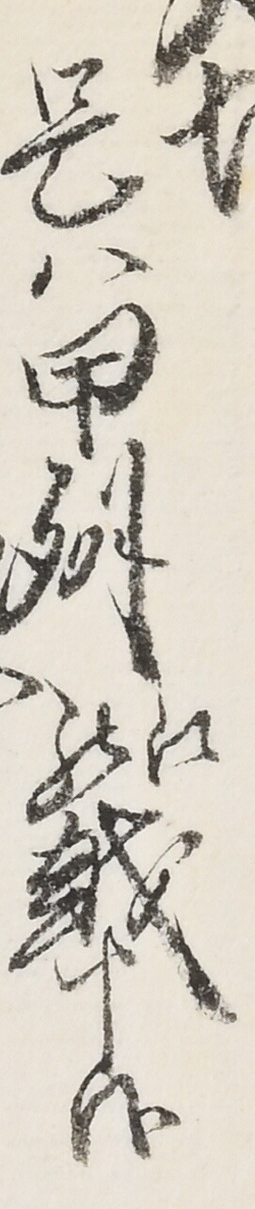是は甲州え罷越申候
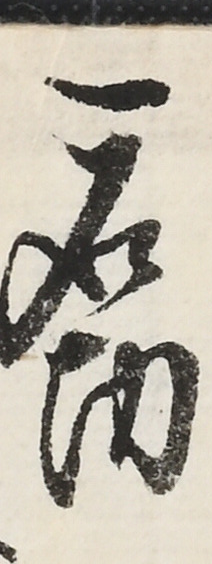一石切
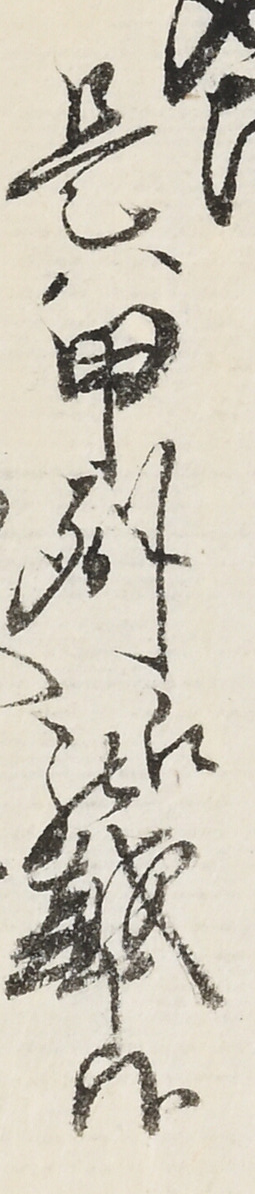是は甲州え罷越申候
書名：安政六己未年二月旅出石切職之者名前書上帳
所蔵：伊那市立高遠町図書館・合同会社AMANE
